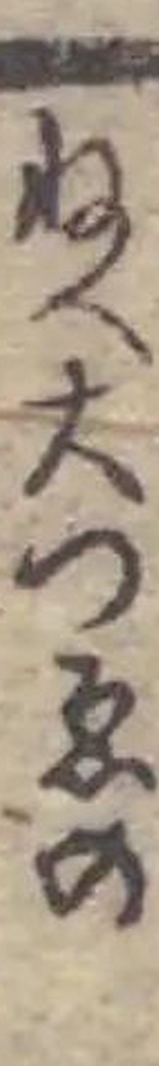ねへ大つゑの
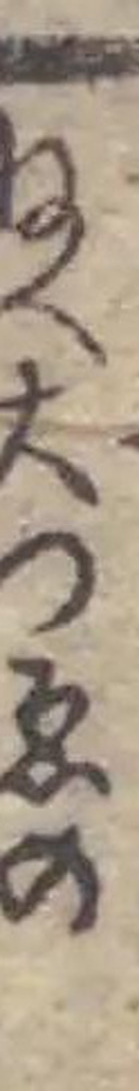ねへ大つゑの
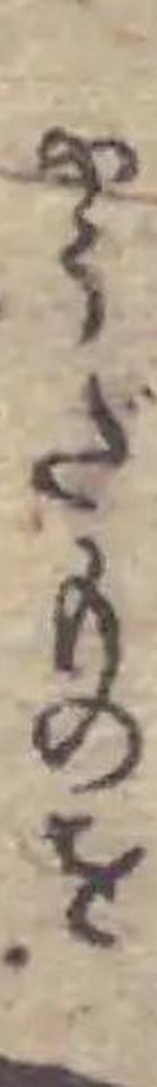やうだものを

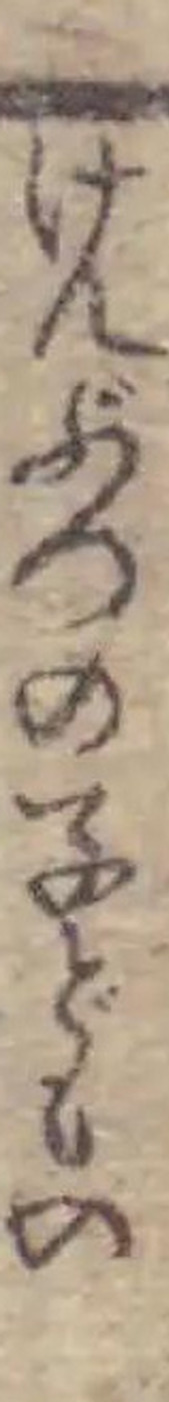けんふつの子どもの
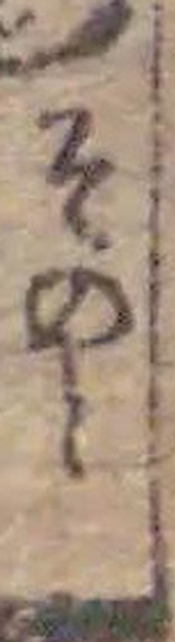そのと
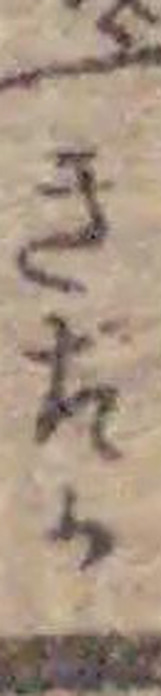きたか
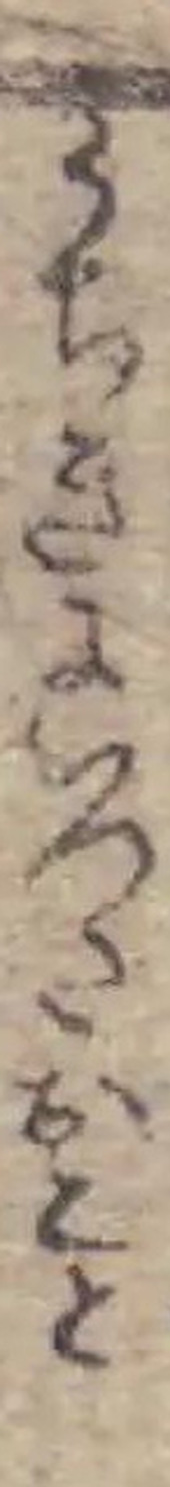うちきにいつたおこと
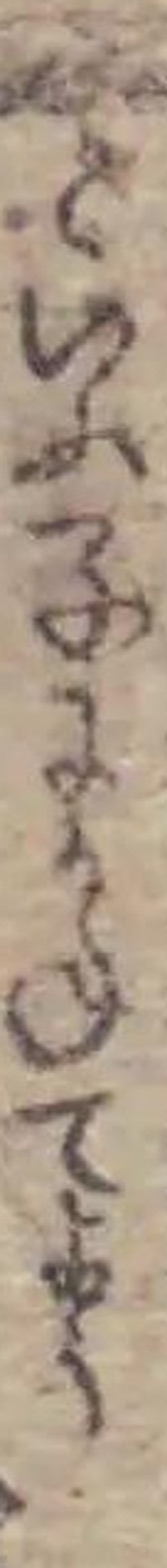といふ子にかねてよう
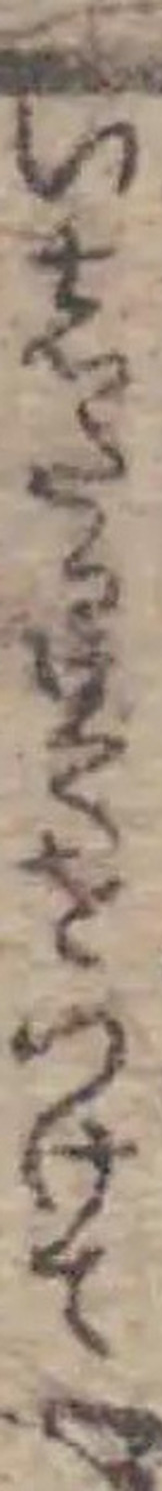いしたる足をつけて
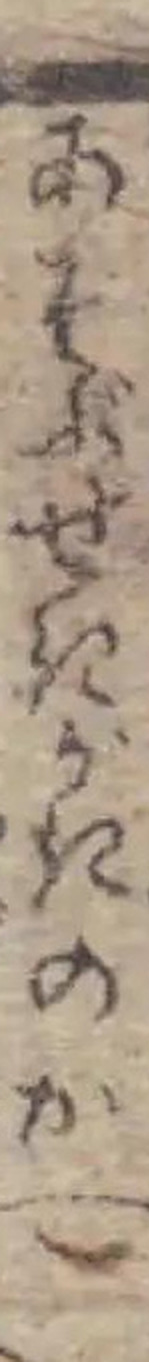あそぶせきかきのか
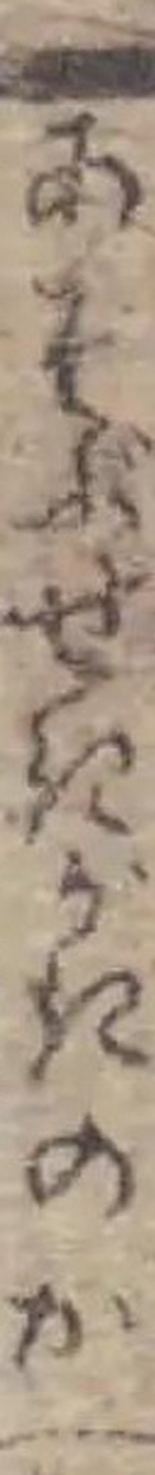あそぶせきかきのか
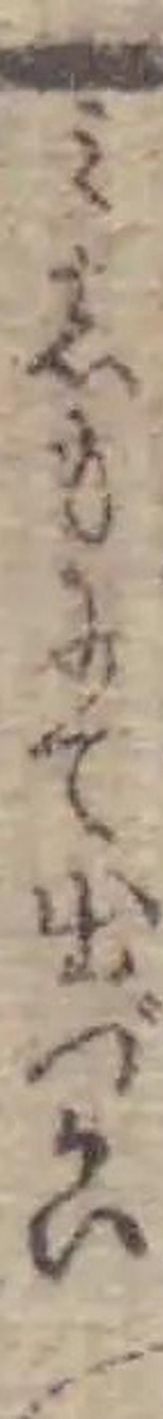みしもにて出づかい
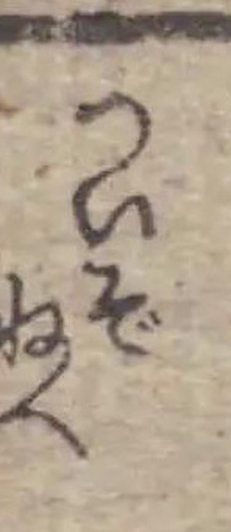ついぞ
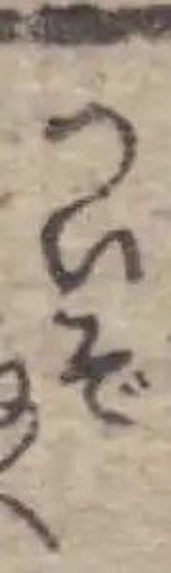ついぞ
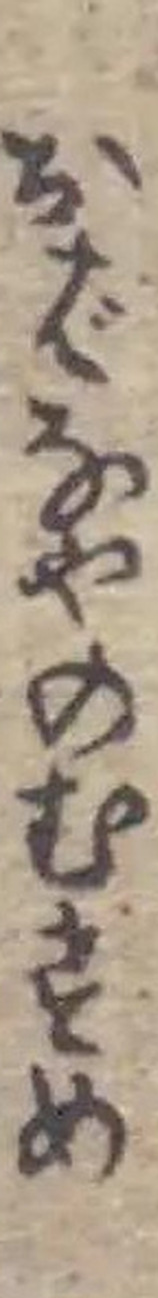おばなやのむすめ
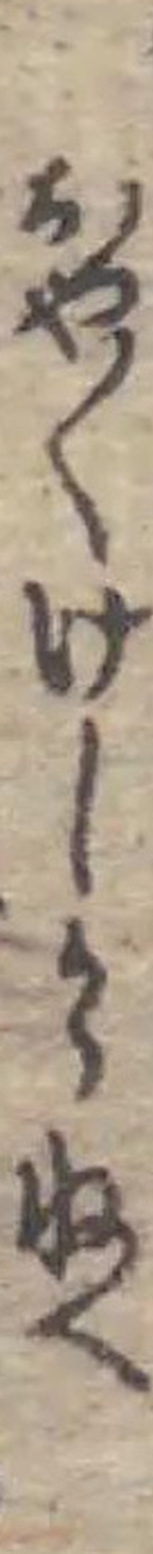おや〳〵けしからねへ
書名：色男其処此処 3巻
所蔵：国立国会図書館 National Diet Library, JAPAN
